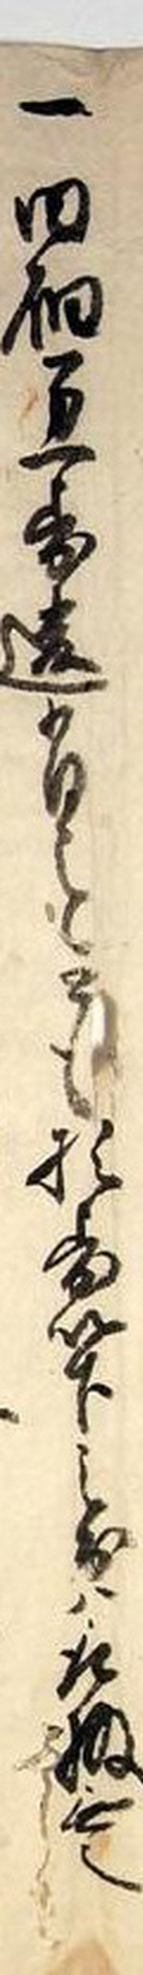一、田畑万一歩違有之と雖も拾歩以下之分ハ取扱無之
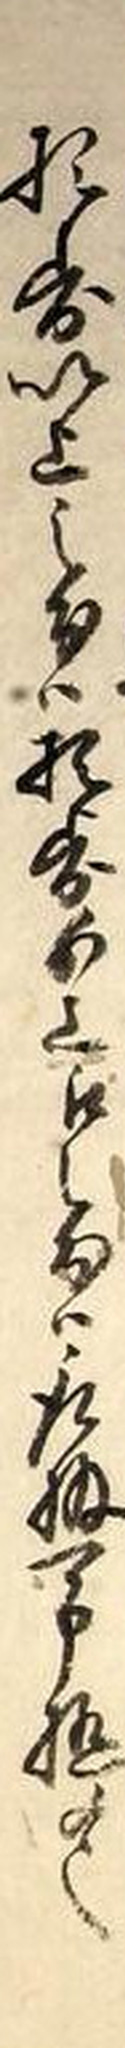拾歩以上之分ハ拾歩より上江之分ハ取扱可申極メ也
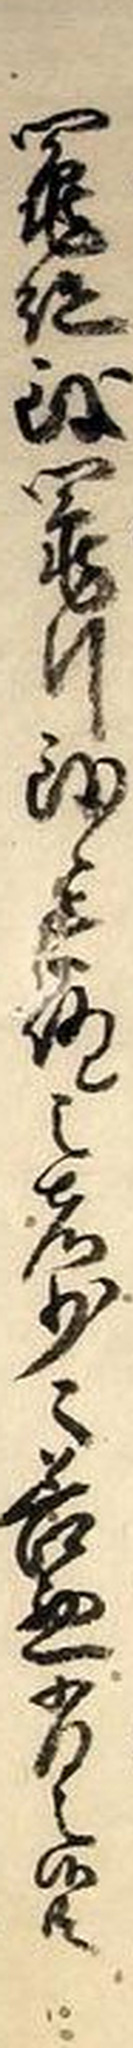鬮組致鬮引致候迄ハ、何レ之者少々善悪有之候共
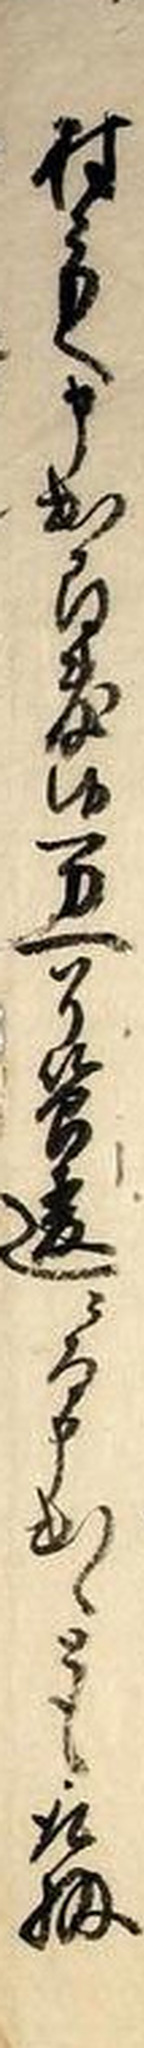村方へ申出間敷候、万一了簡違ニ而申出候とも取扱
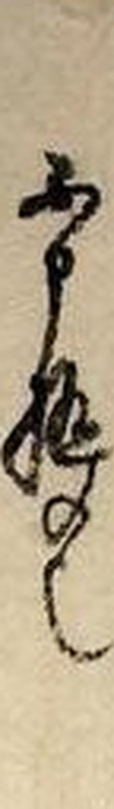不申極メ也
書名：相定メ申一札之事（桑植付之儀等ニ付）
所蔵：福井県文書館 Fukui Prefectural Archives
